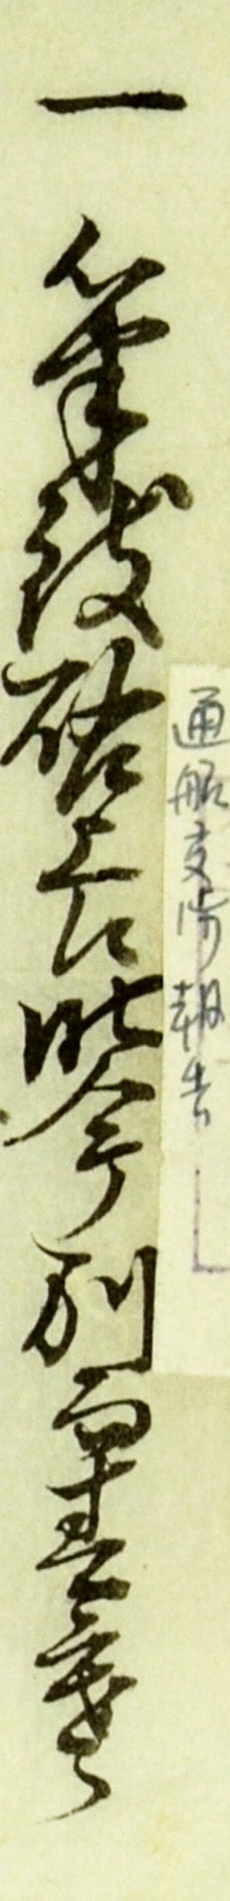一筆啓上候昨今別而甚寒
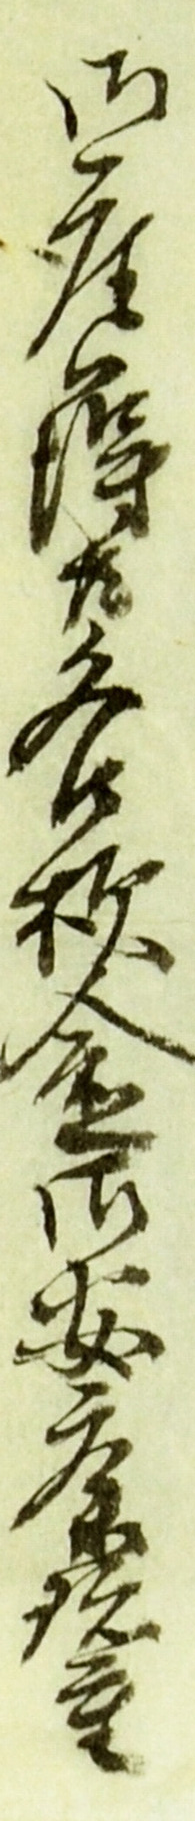御座候得共各様全御安康珍重
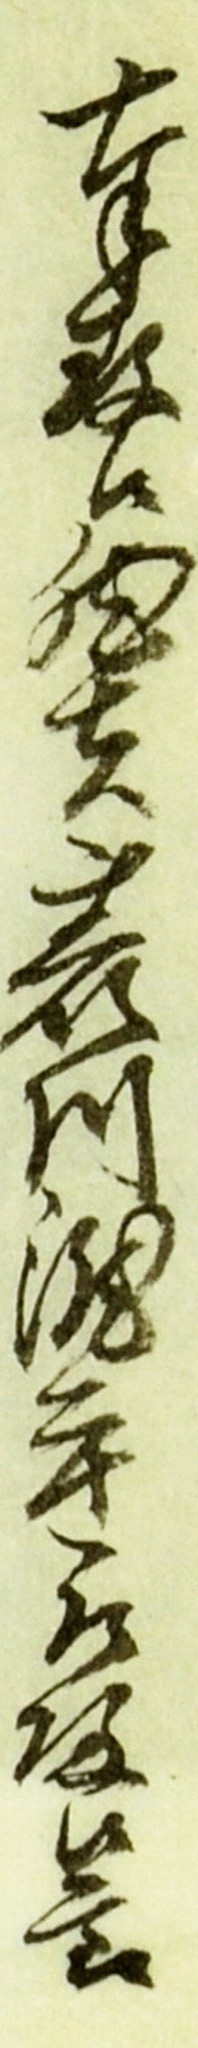奉存候然者表川瀧平罷帰候節
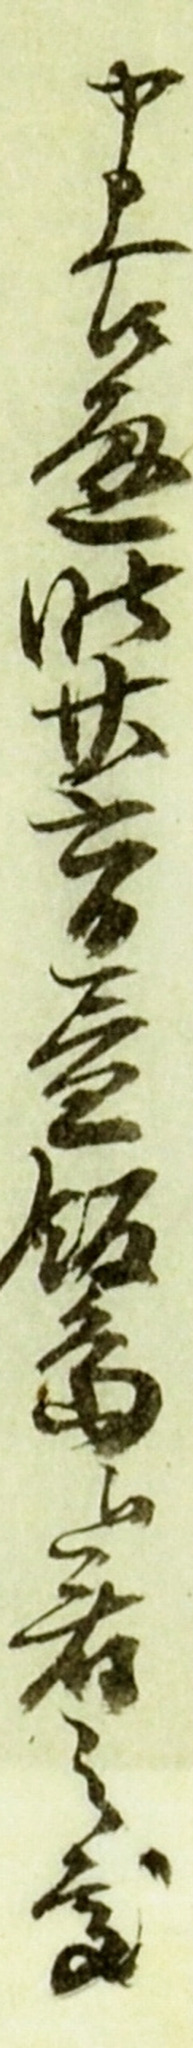申上候通昨廿六日昼飯当江着候処
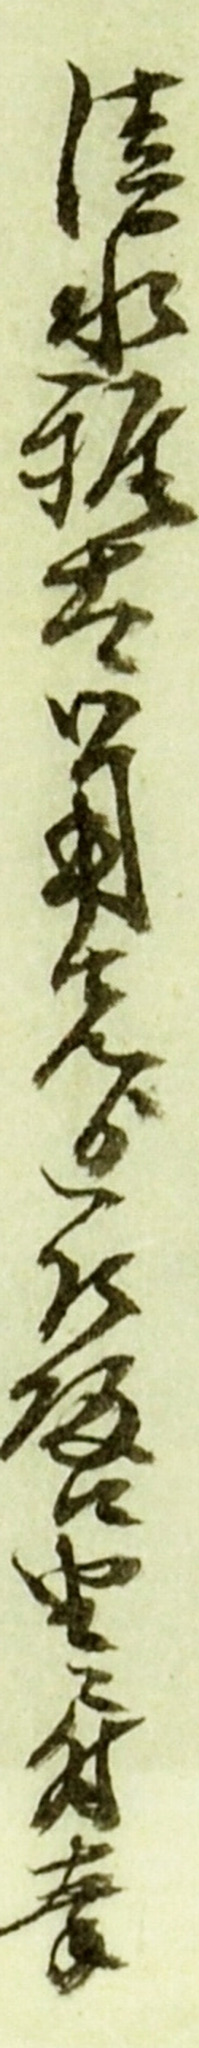清水雅太御用先ヨリ罷帰候由ニ付幸
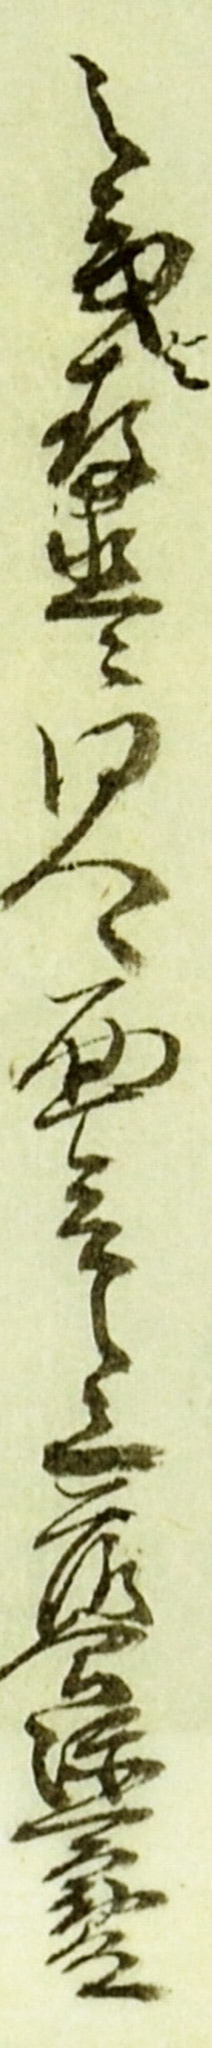之義与存直ニ同人へ面会之上落合弥一郎殿
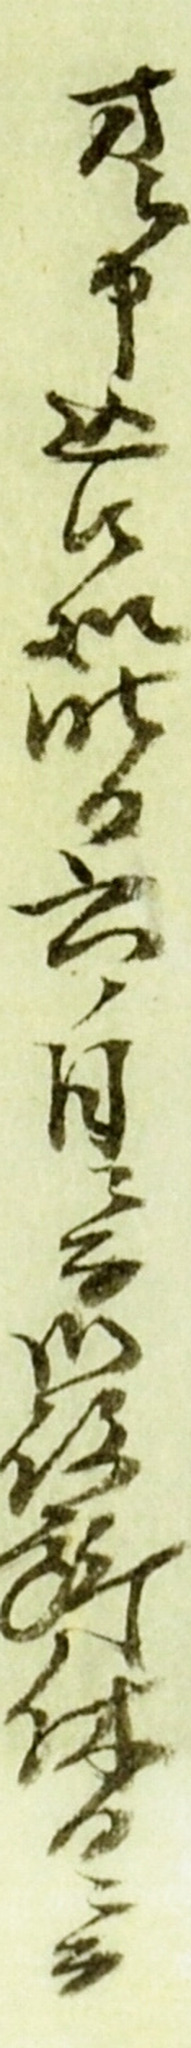方ニ申込候処昨日六ノ日ニ而御役所休日ニ而
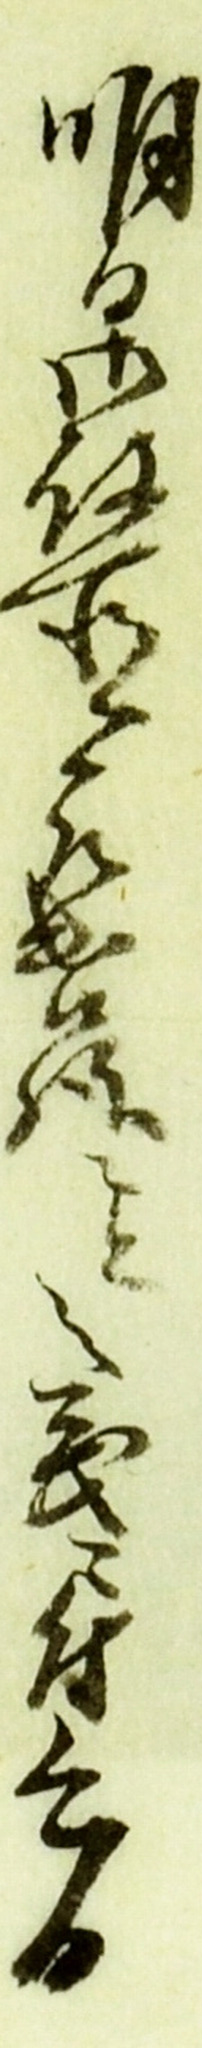明日御役所へ罷出候様ニと之義ニ付、今日
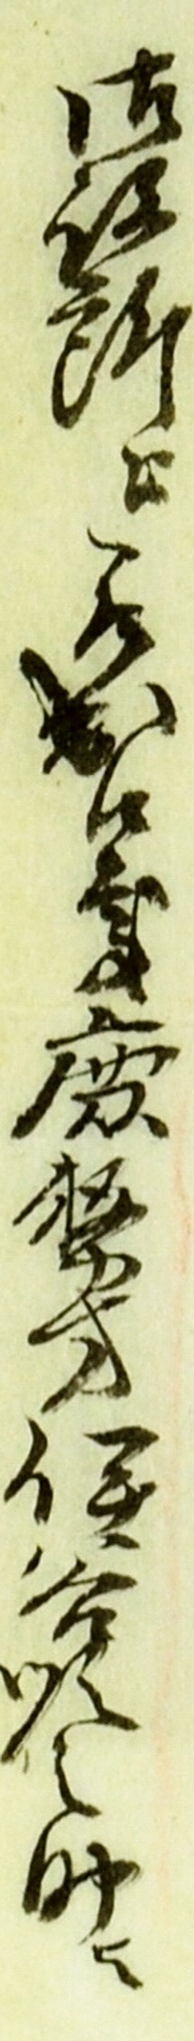御役所江罷出候処庶務方伊谷順之助与
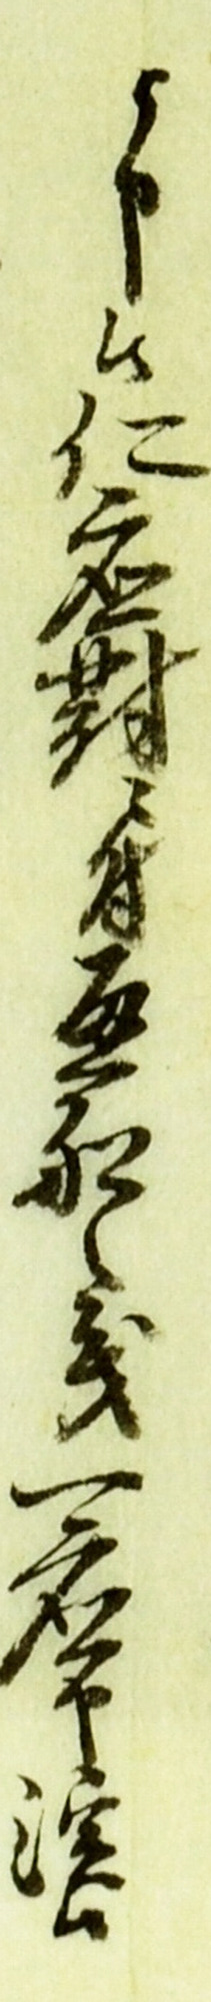被申候仁応対ニ付着船之義一応申談候
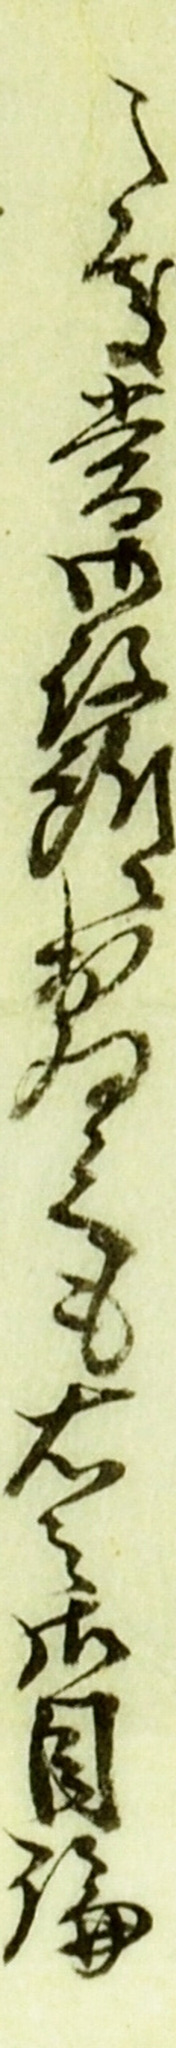之処当御役所ニおゐても右之御目論
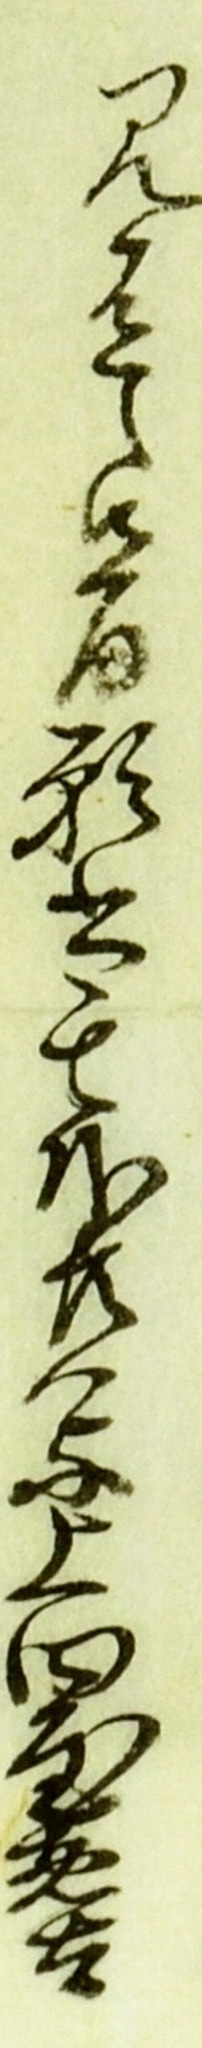見有之候旨願書其外共写上田屋惣太
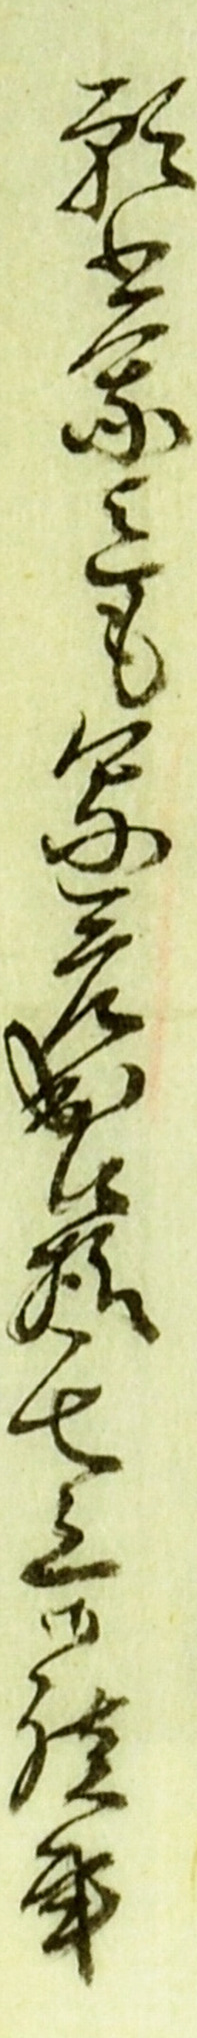願書余迄も写差出候様其上御諸事
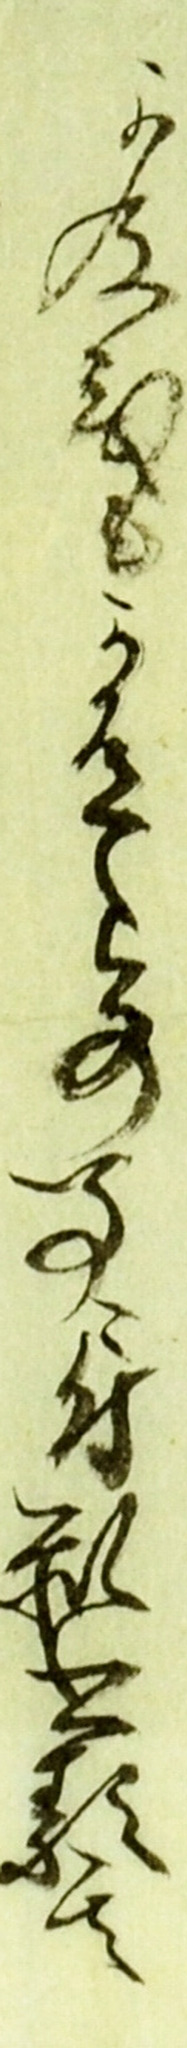可及義も可有之との事ニ付願書類其
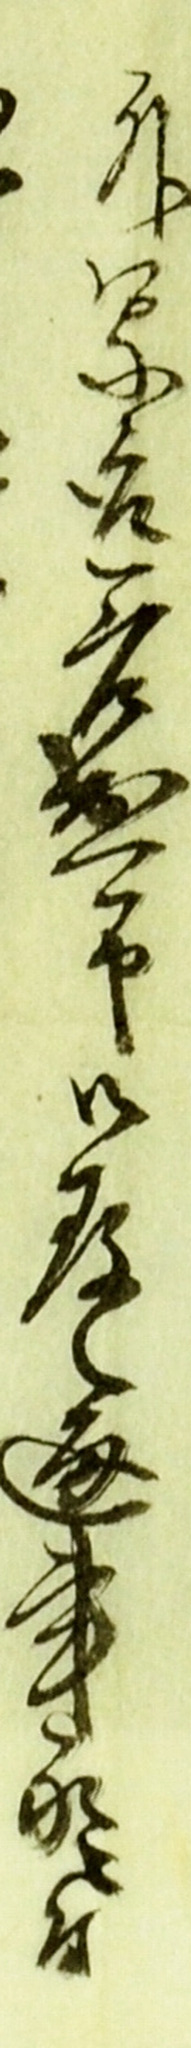外写取差出可申御存之通事承ニ付
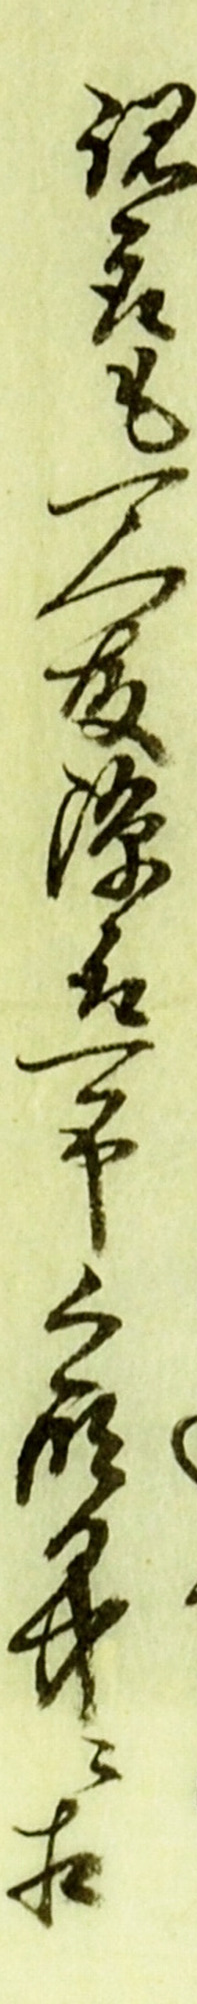認取も一人故隙取可申今般日中ニ相
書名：書状
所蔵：伊那市立高遠町図書館・合同会社AMANE
